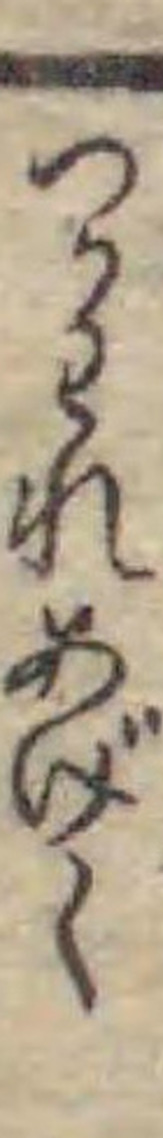つかわれあげく
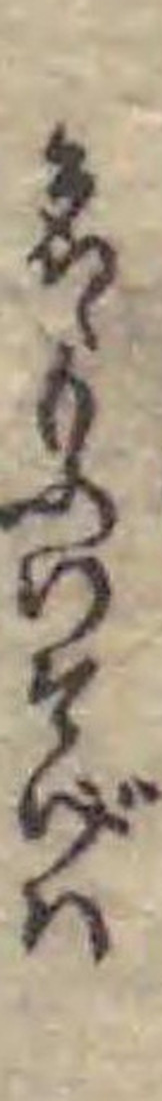ゑゝもふいそげは
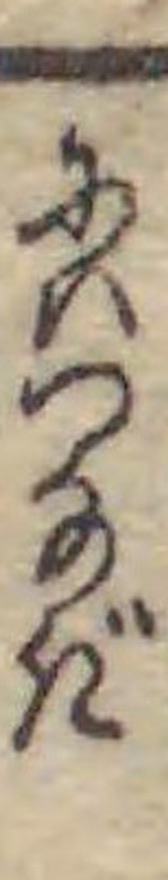にはつなぎ
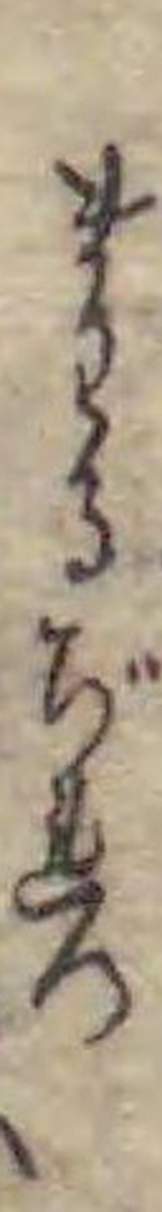まわるぢれつ
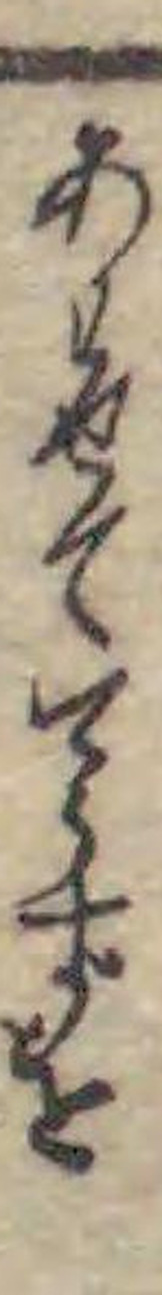あわせててうずを
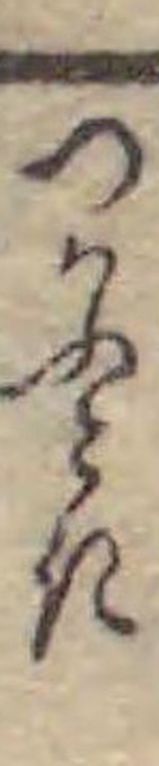つかふとき
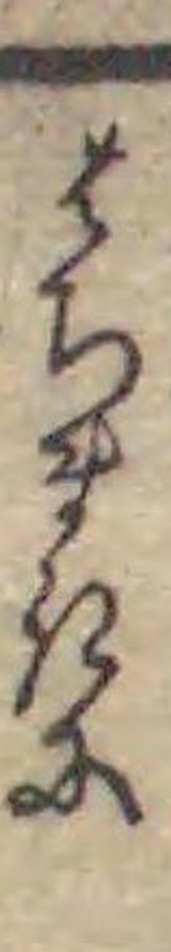はちまきに
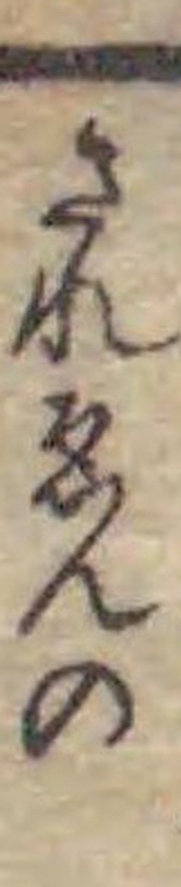されゑんの
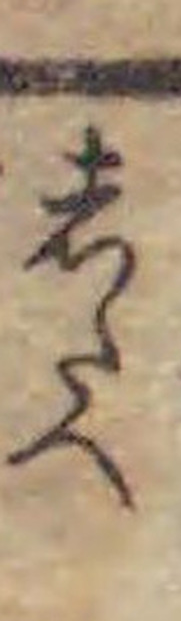したへ
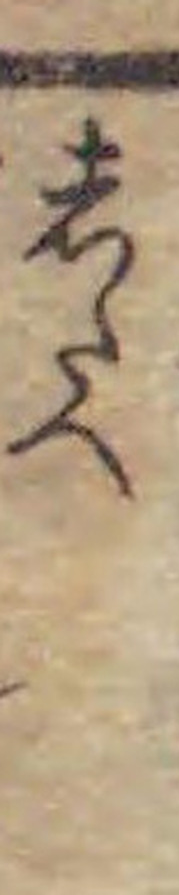したへ
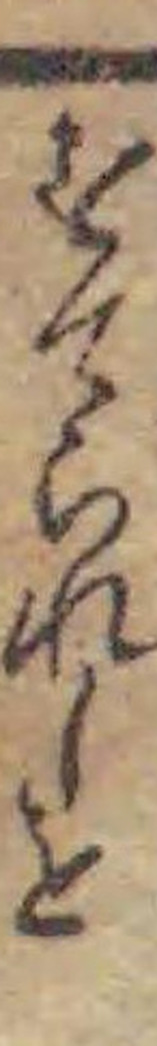すてられしを
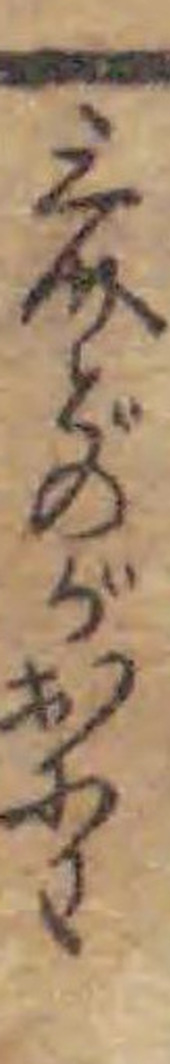三介どのがおにわ
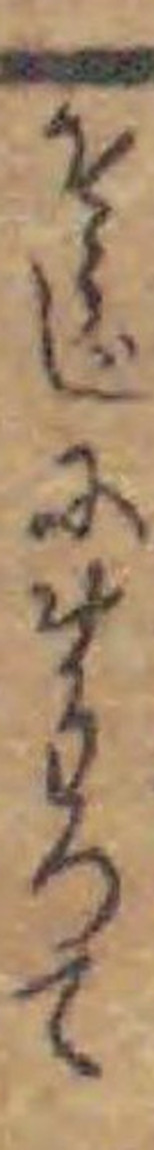そうじにまわつて
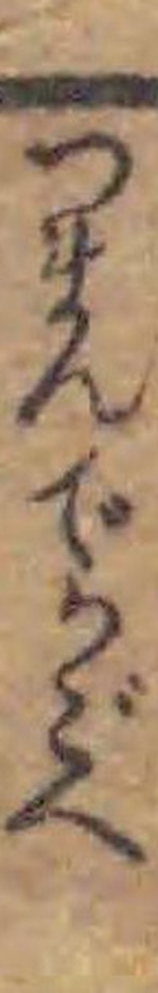つまんでかごへ
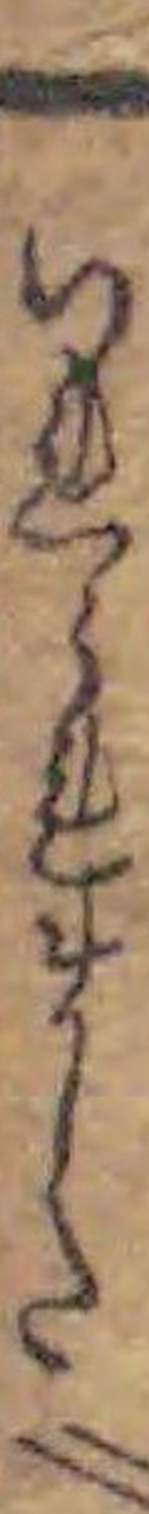いれられました

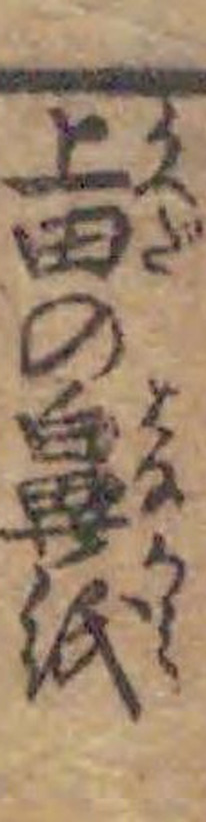上田の鼻紙
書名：紙屑身上噺 : 3巻
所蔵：国立国会図書館 National Diet Library, JAPAN
